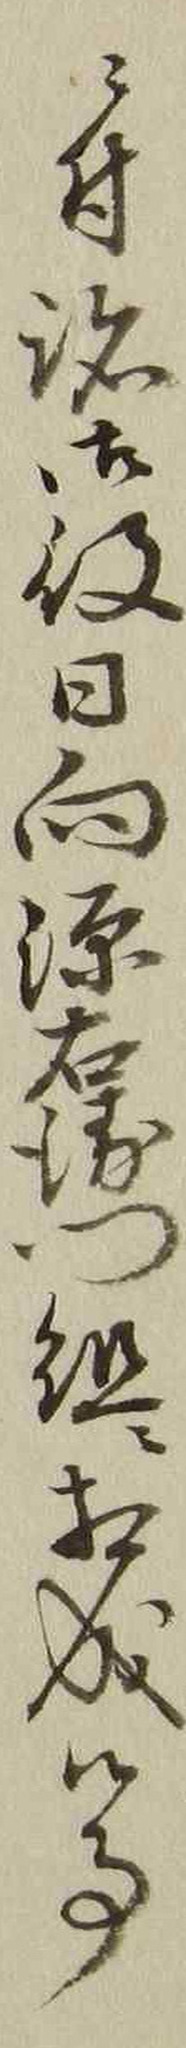ニ付跡御役日向源右衛門組ニ相成候事
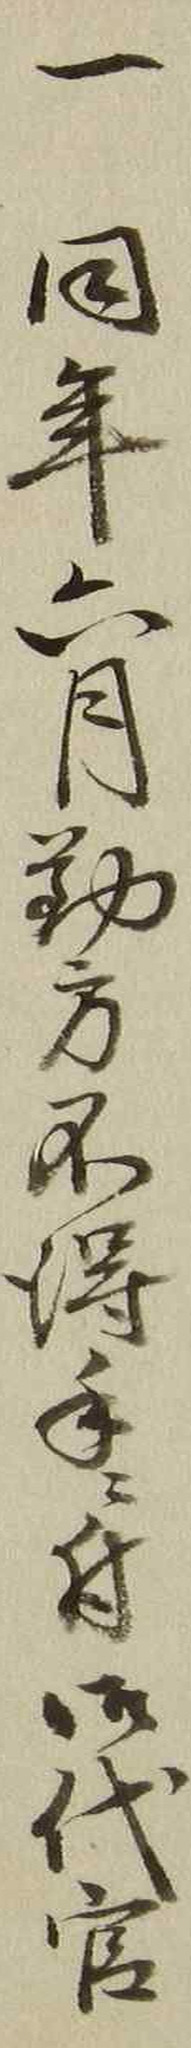一同年六月勤方不得手ニ付御代官
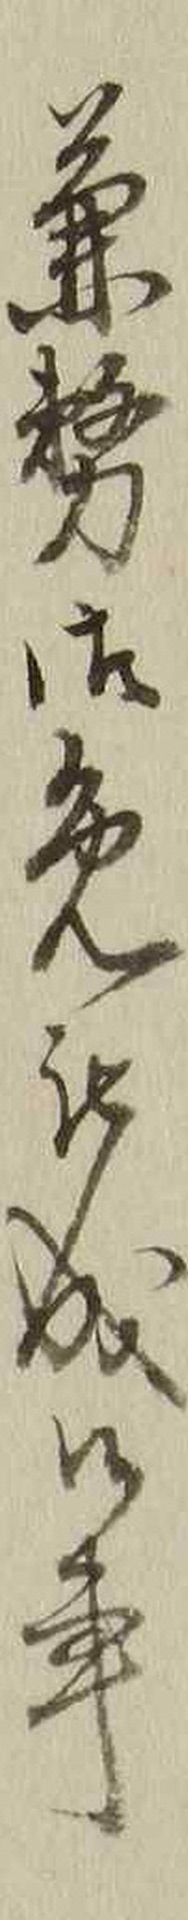兼務御免被成候事
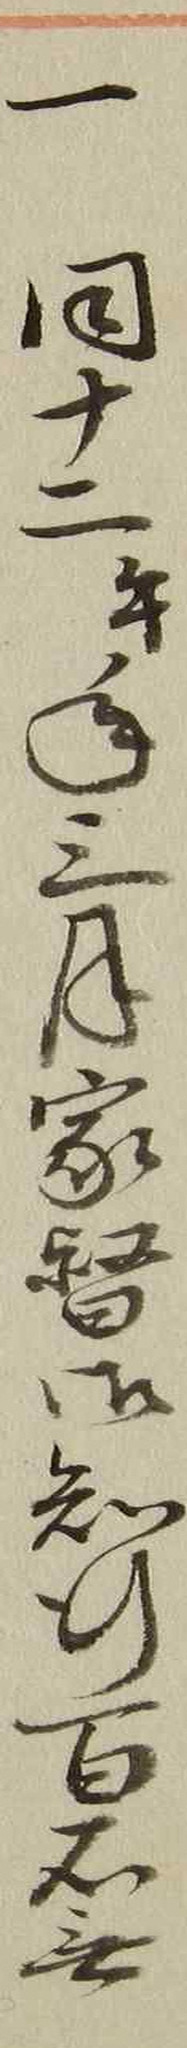一同十二午年三月家督御知行百石無
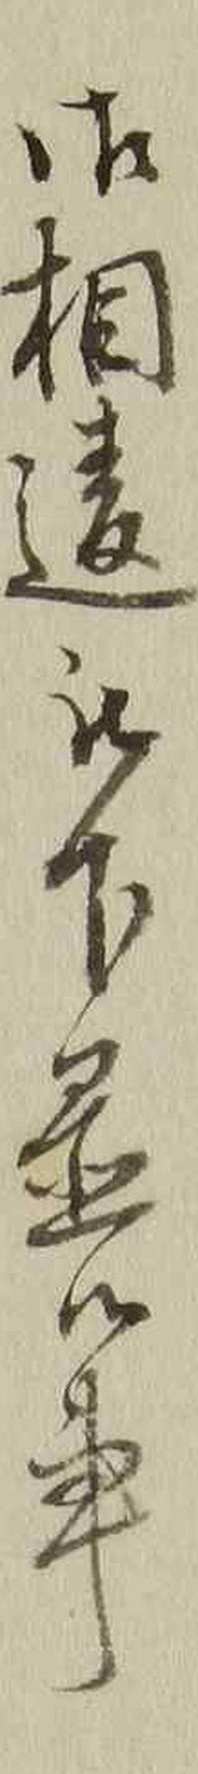御相違被下置候事
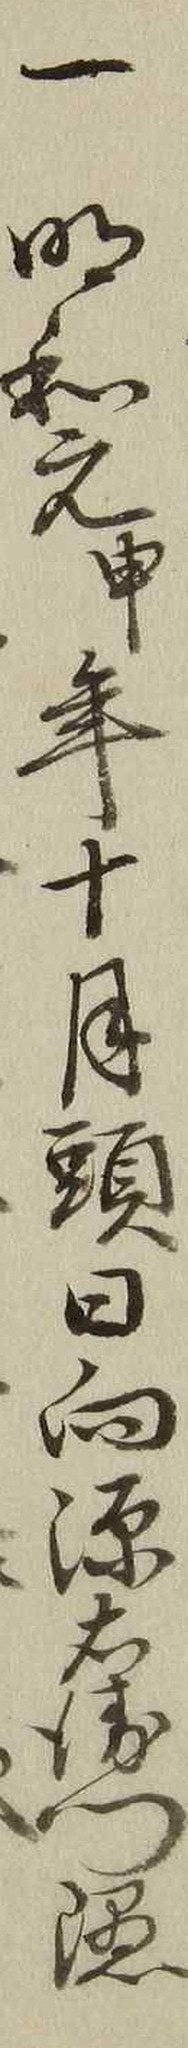一明和元申年十月頭日向源右衛門隠
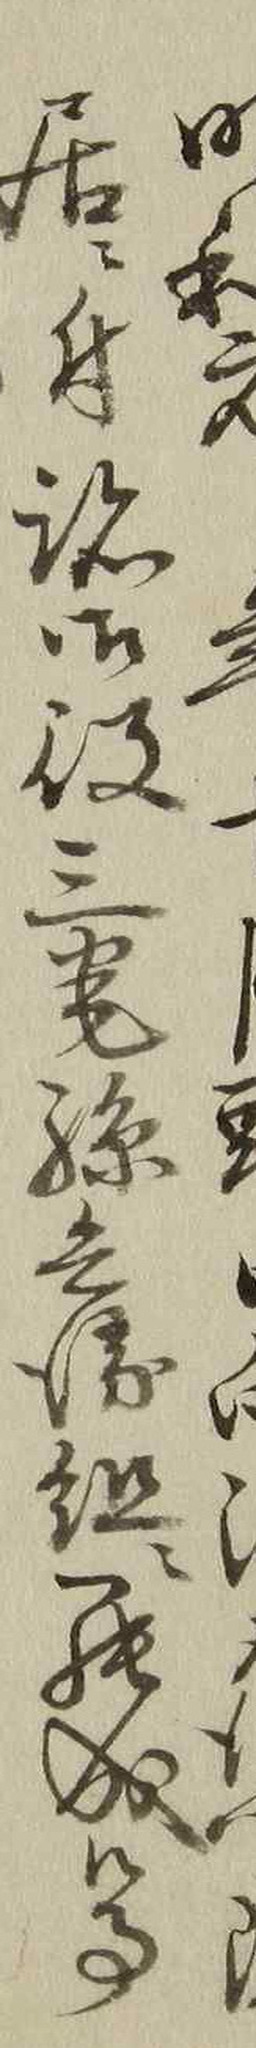居ニ付跡御役三宅孫兵衛組ニ罷成候事
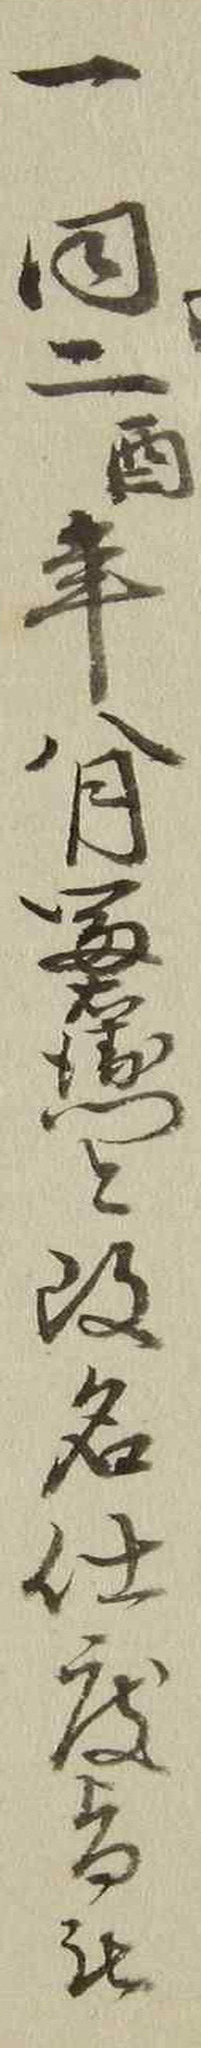一同二酉年八月冨右衛門と改名仕度旨被
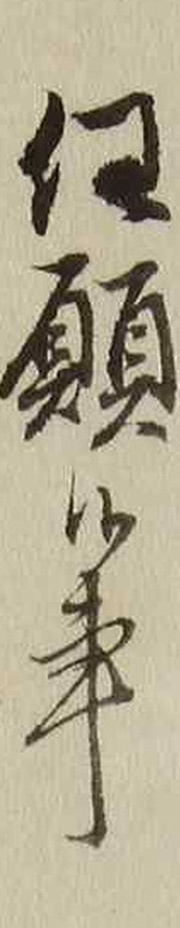任願候事
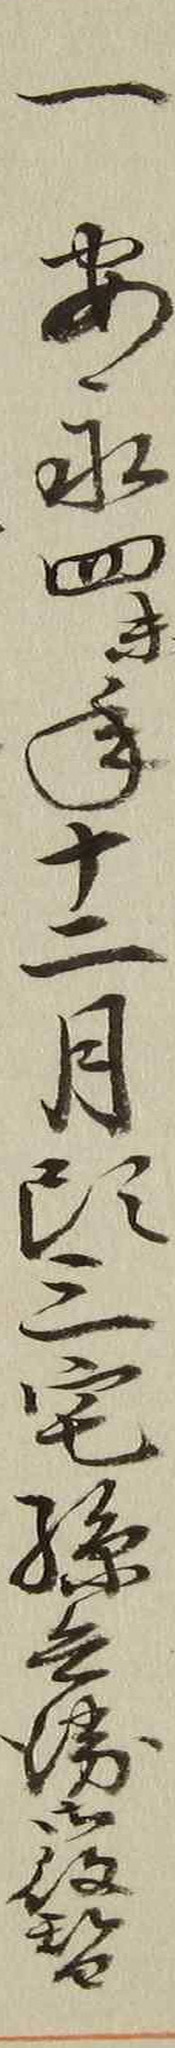一安永四未年十二月頭三宅孫兵衛御役替
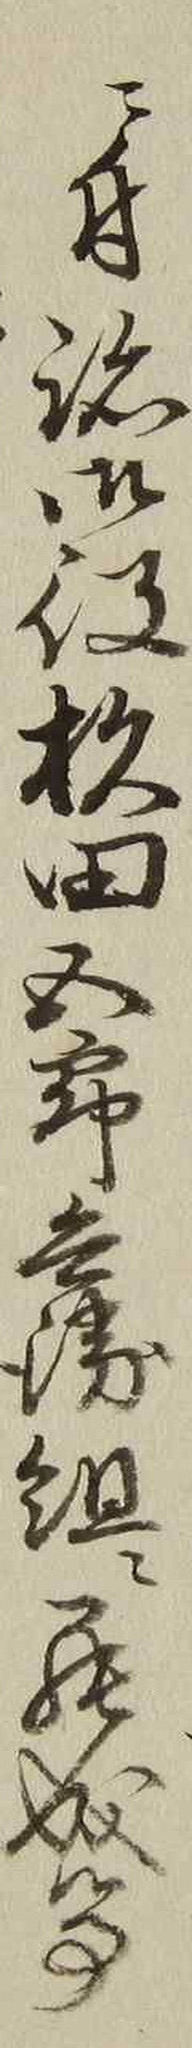ニ付跡御役杉田五郎兵衛組ニ罷成候事
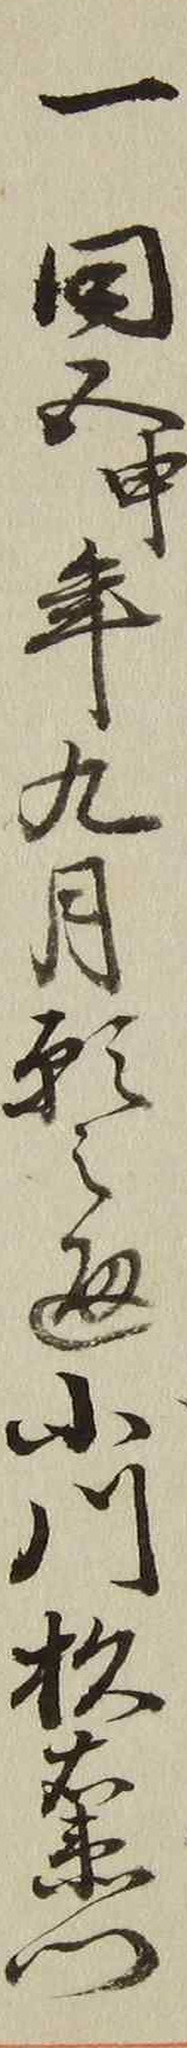一同五申年九月願之通小川杉右衛門
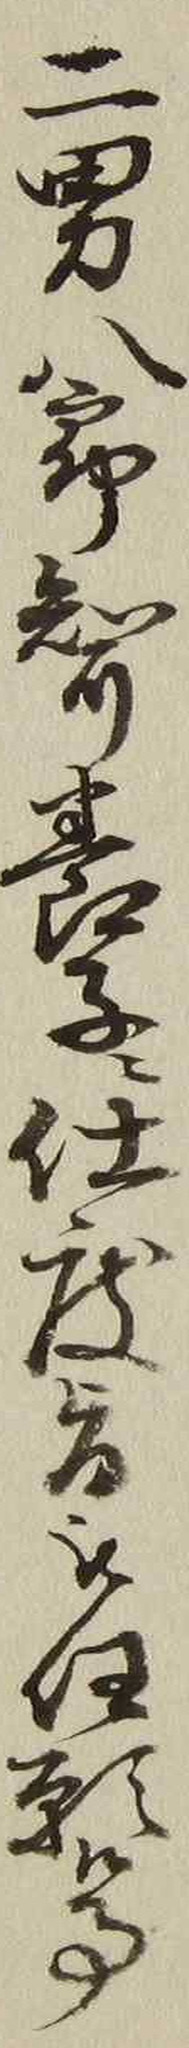二男八郎聟養子ニ仕度旨被任願候事
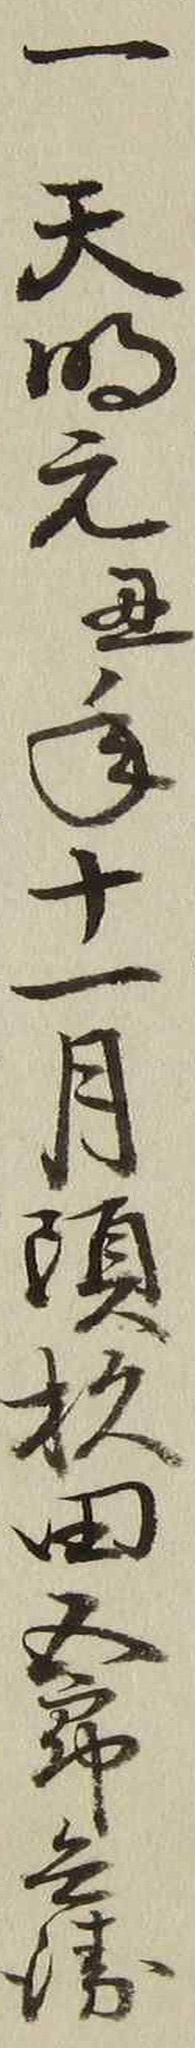一天明元丑年十一月頭杉田五郎兵衛
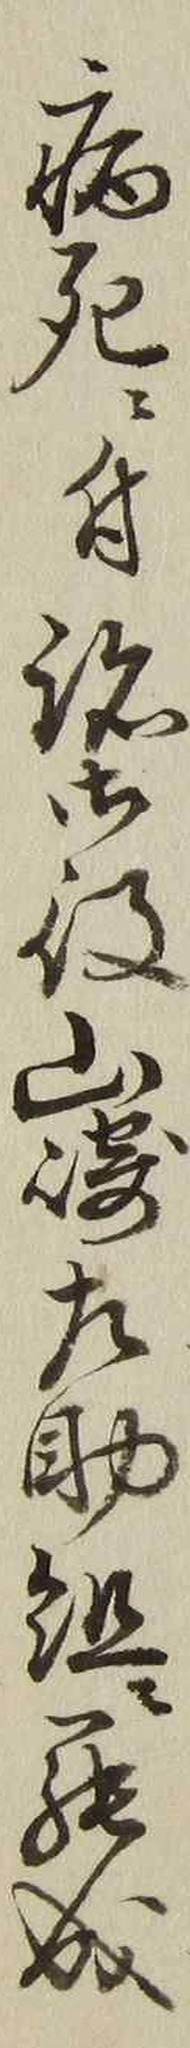病死ニ付跡御役山崎左助組ニ罷成
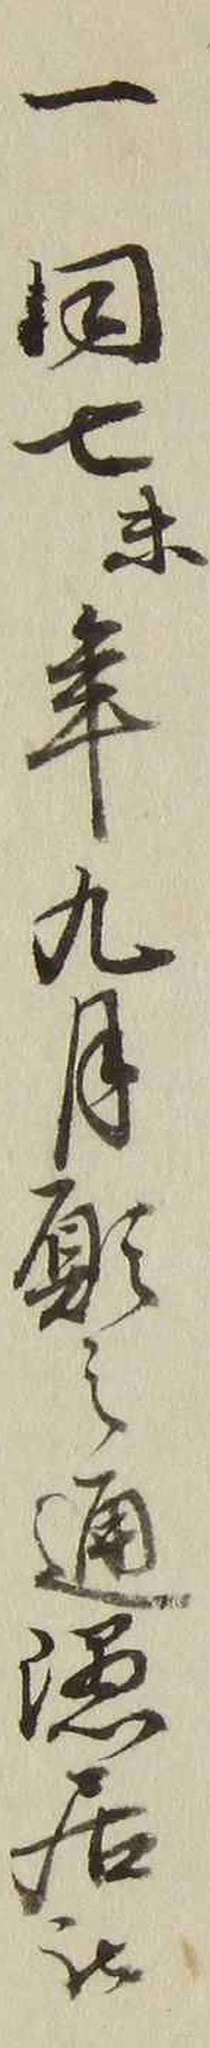一同七未年九月願之通隠居被
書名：諸士系譜　巻之27　い之部27
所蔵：会津若松市立会津図書館
